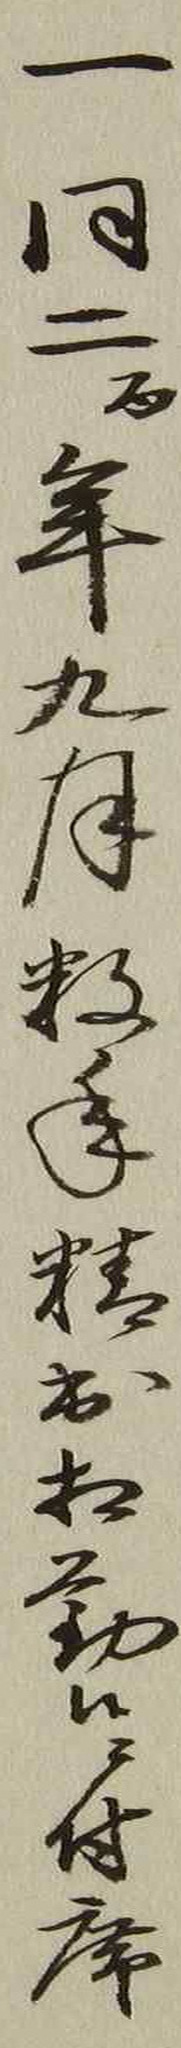一同ニ酉年九月数年精出相勤候ニ付席
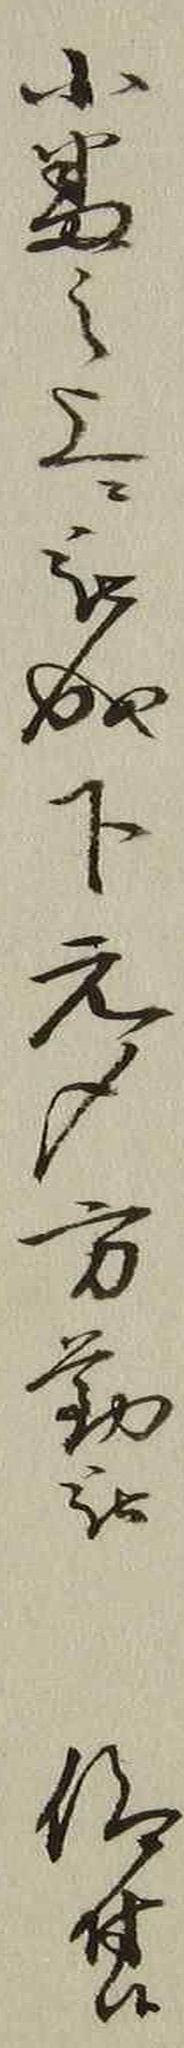小番之上ニ被成下元〆方勤被仰付候
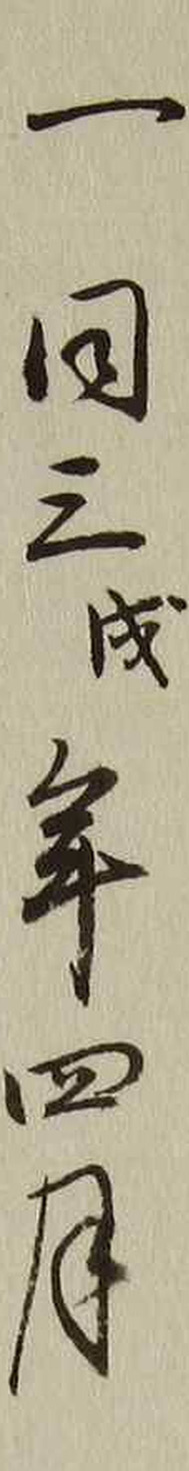一同三戌年四月
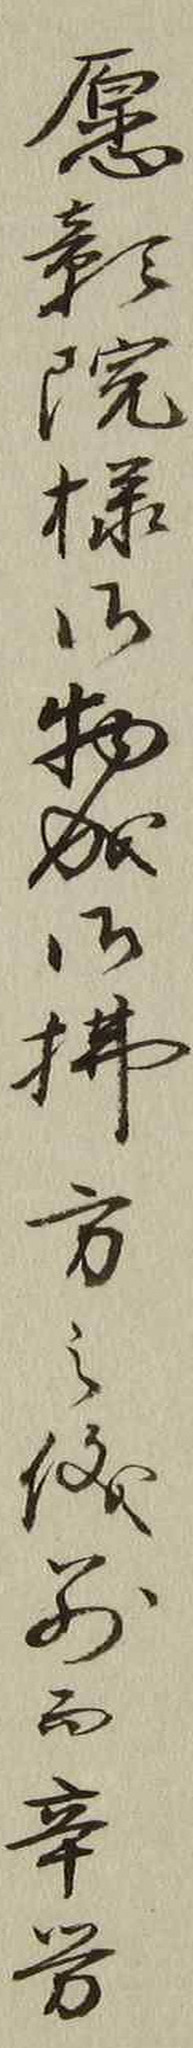愿影院様御物成御払方之儀別而辛労
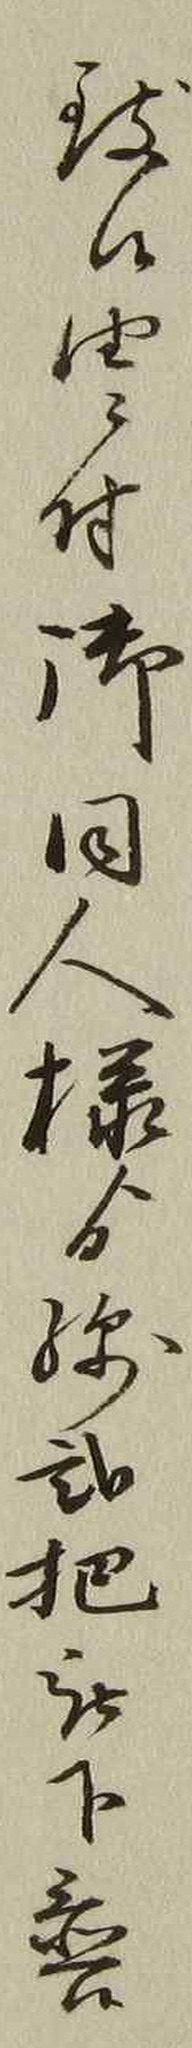致候由ニ付御同人様ゟ綿弐把被下置候
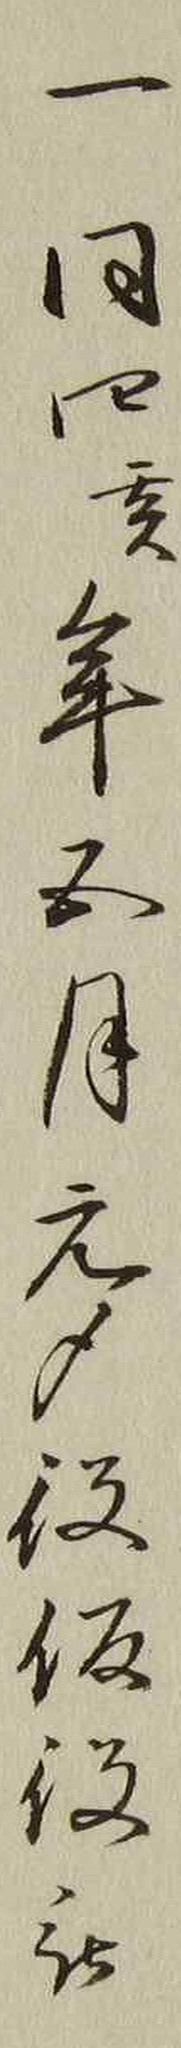一同四亥年五月元〆役仮役被
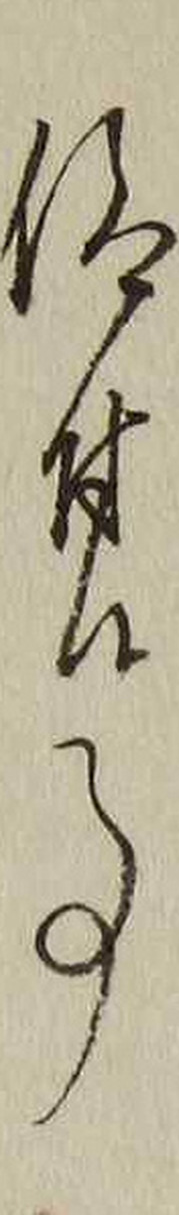仰付候事
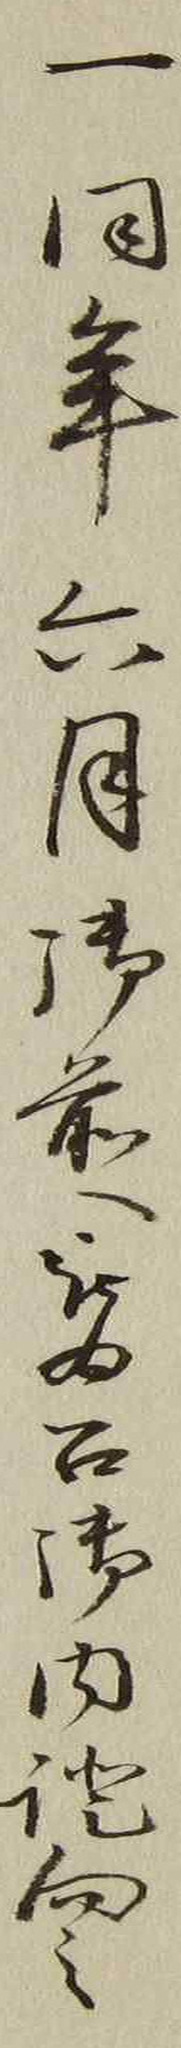一同年六月御前へ被ゐ召御内証向之
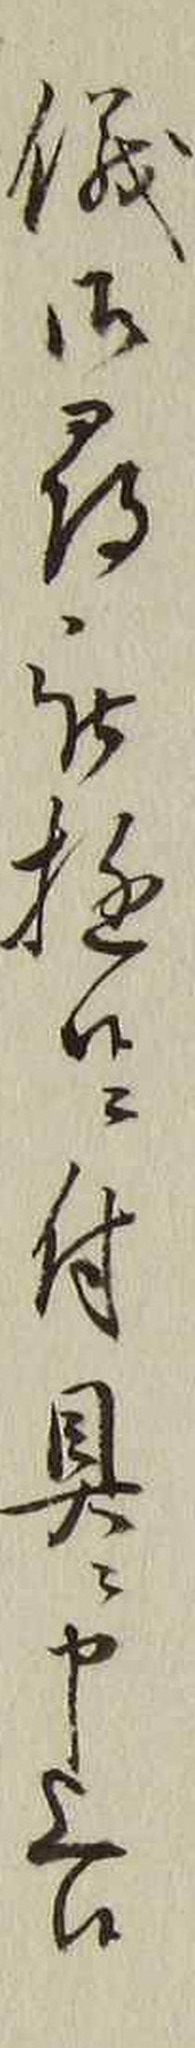義御尋被遊候ニ付具ニ申上候
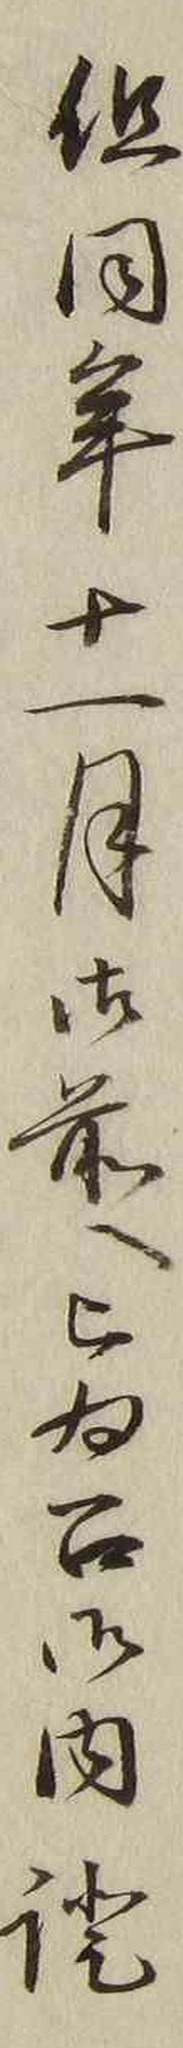但同年十一月御前へ被ゐ召御内証
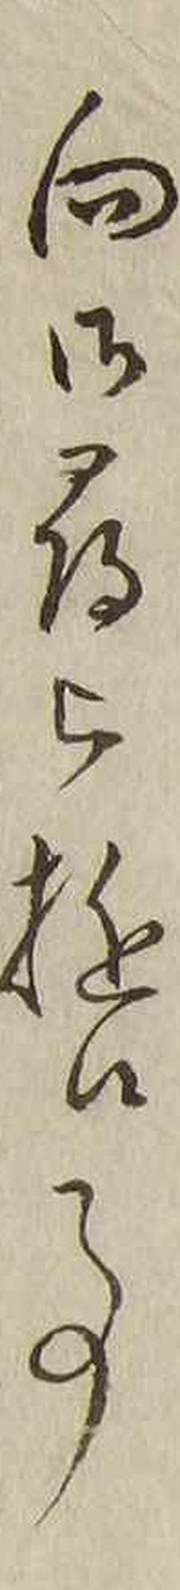向御尋被遊候事

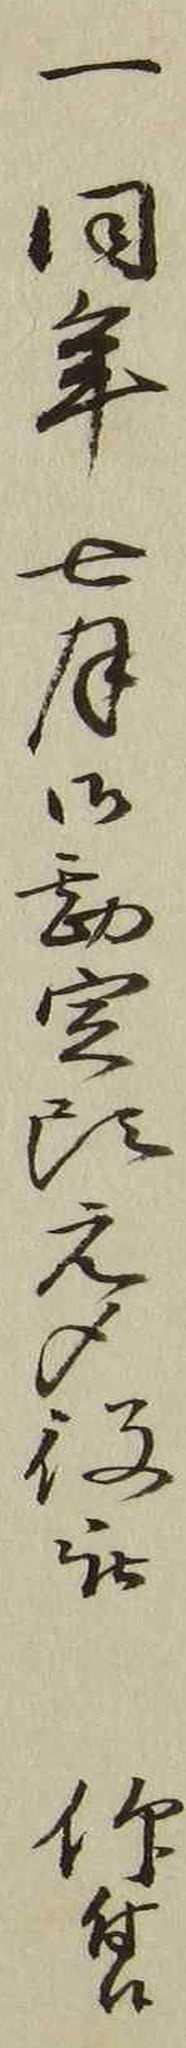一同年七月御勘定頭元〆役被仰付候
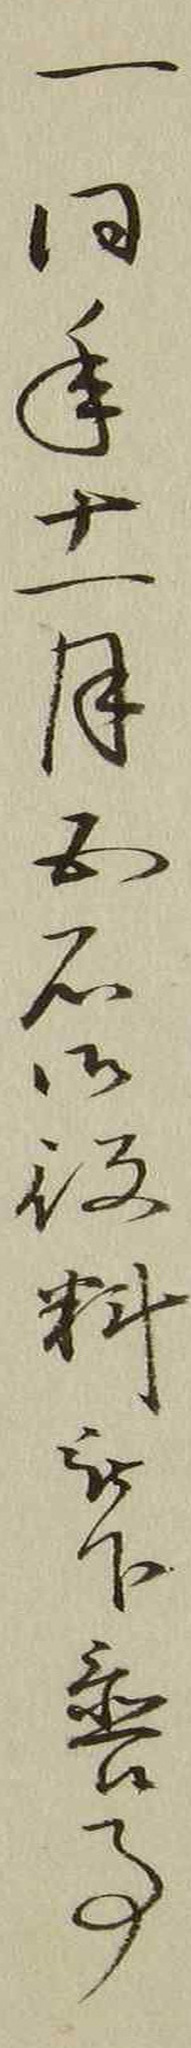一同年十一月五石御役料被下置候事
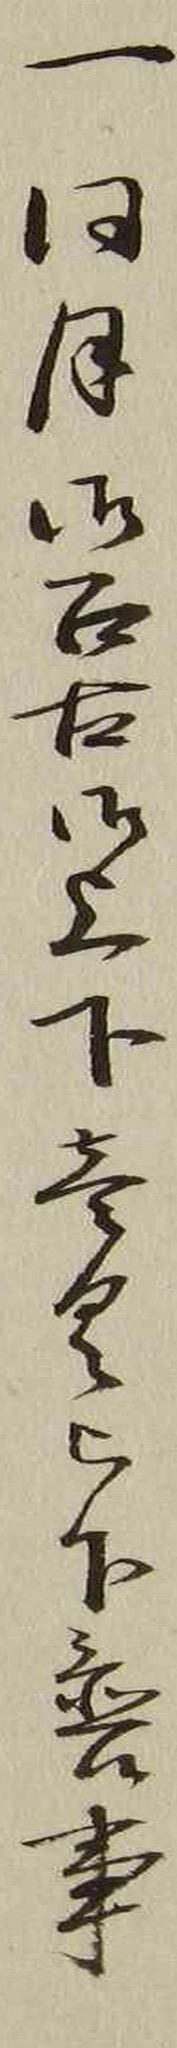一同月御召古御上下壱具被下置候事
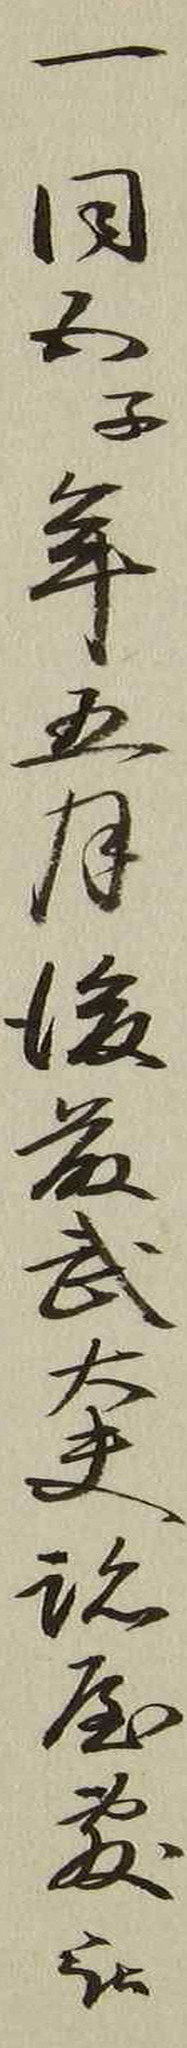一同五子年五月後藤武太夫跡屋敷被
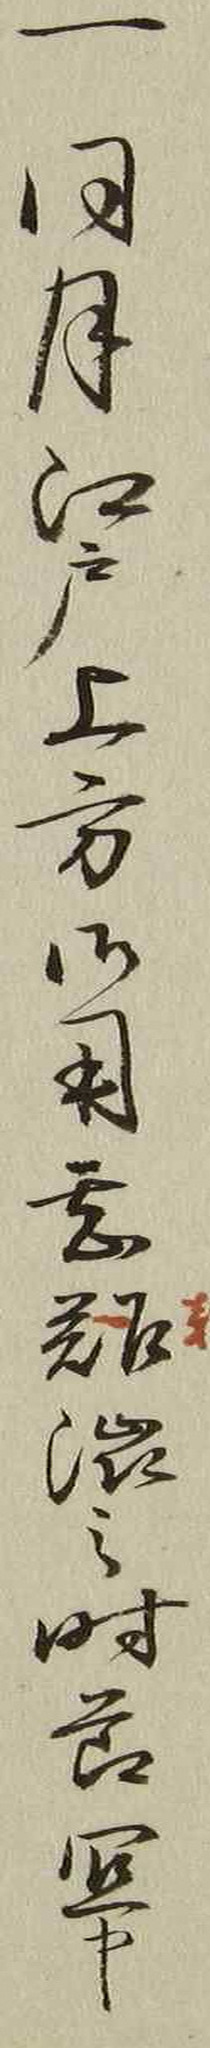一同月江戸上方御用甚難渋之時節宣申
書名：諸士系譜　巻之114　か之部22
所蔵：会津若松市立会津図書館
